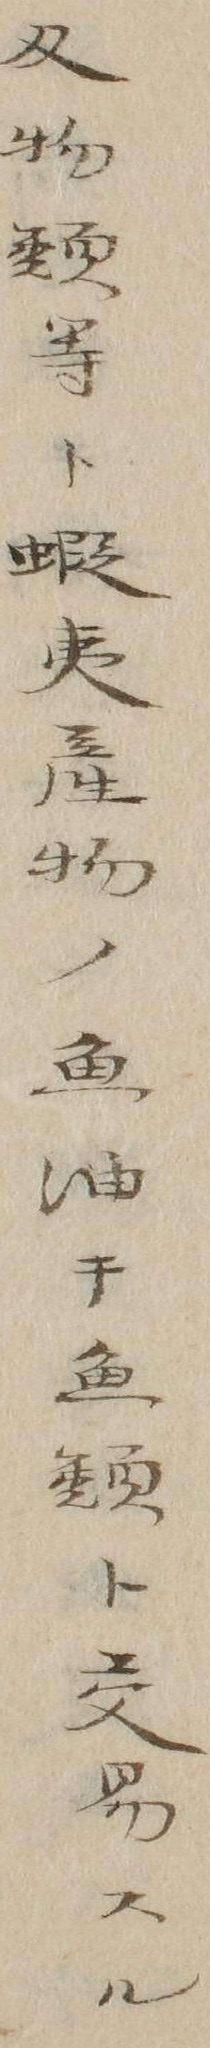刃物類等ト蝦夷産物ノ魚油干魚類ト交易スル
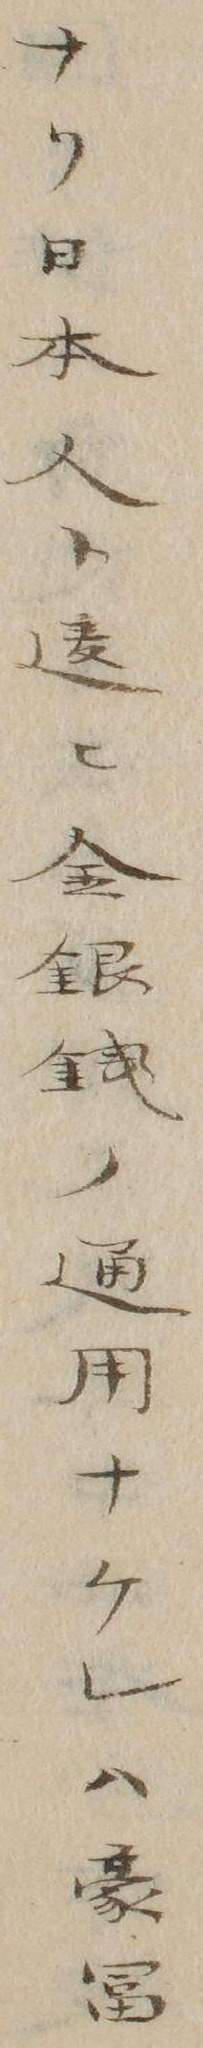ナリ日本人ト違ヒ金銀銭ノ通用ナケレハ豪富
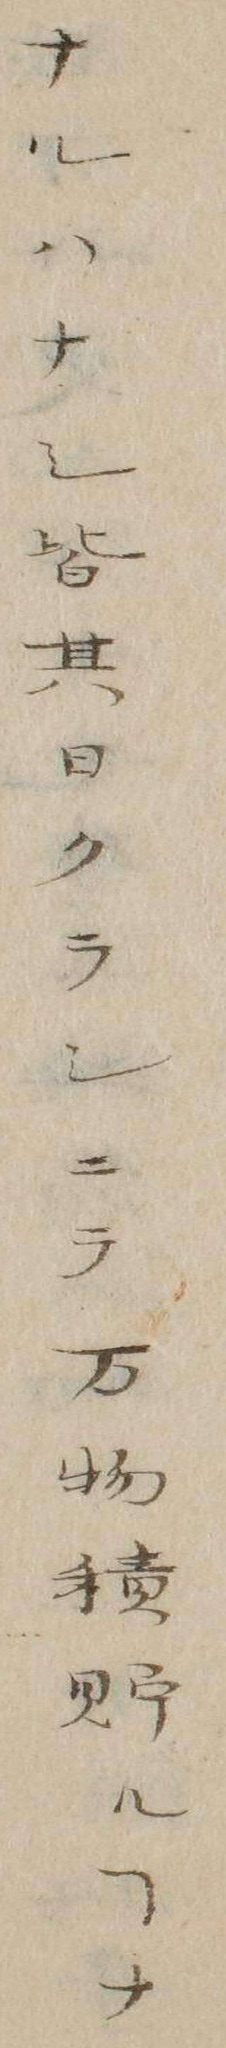ナルハナシ皆其日クラシニテ万物積貯ルヿナ
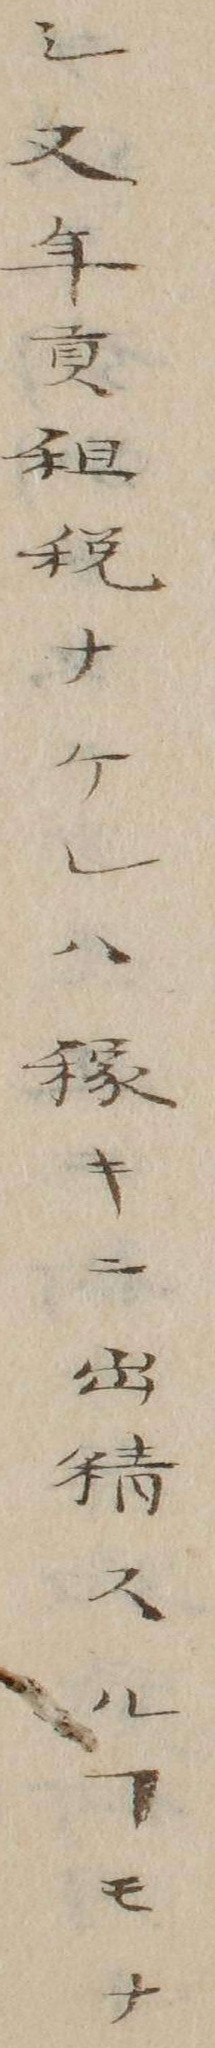シ又年貢租税ナケレハ稼キニ出精スルヿモナ
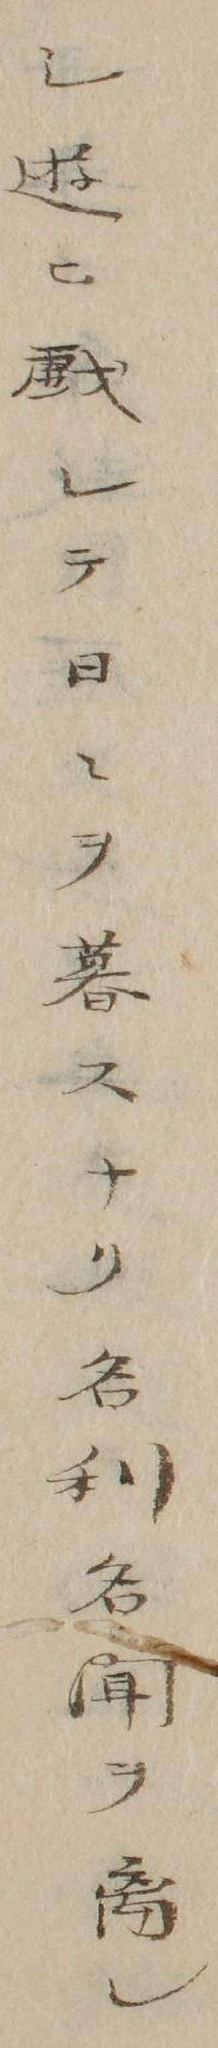シ遊ヒ戯レテ日々ヲ暮スナリ名利名聞ヲ離レ
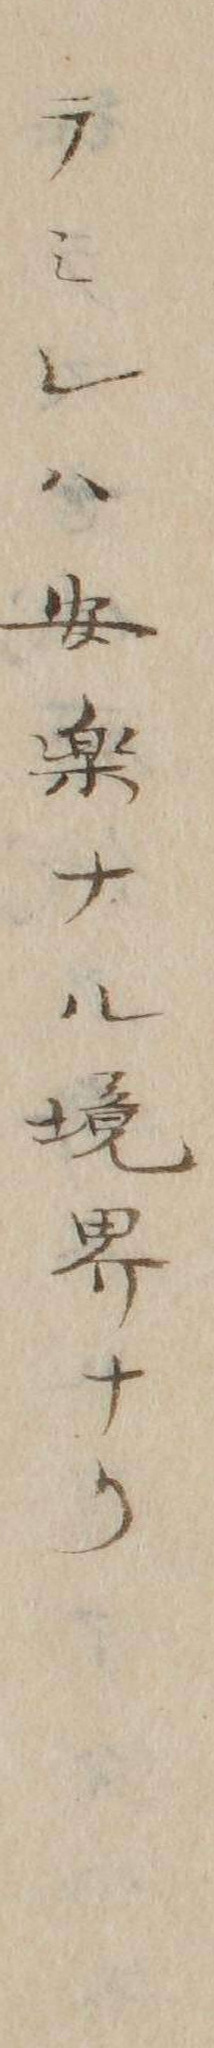テミレハ安楽ナル境界ナリ
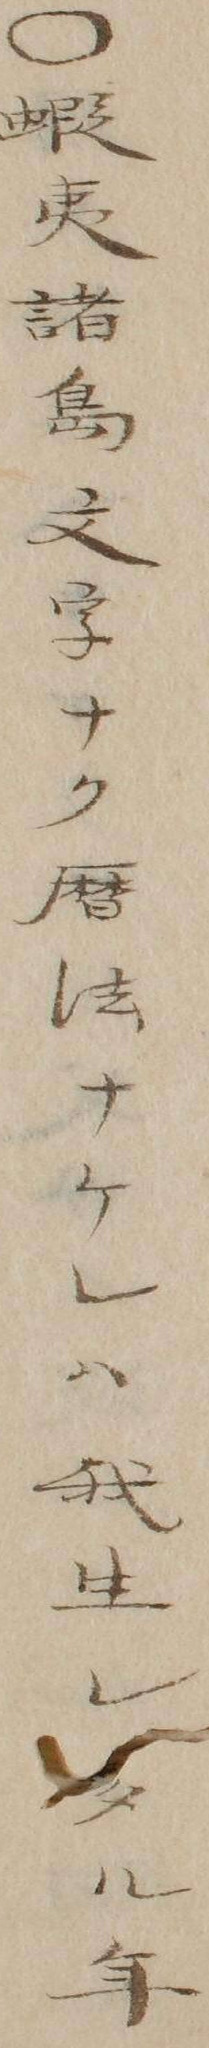〇蝦夷諸島文字ナク暦法ナケレハ我生シタル年

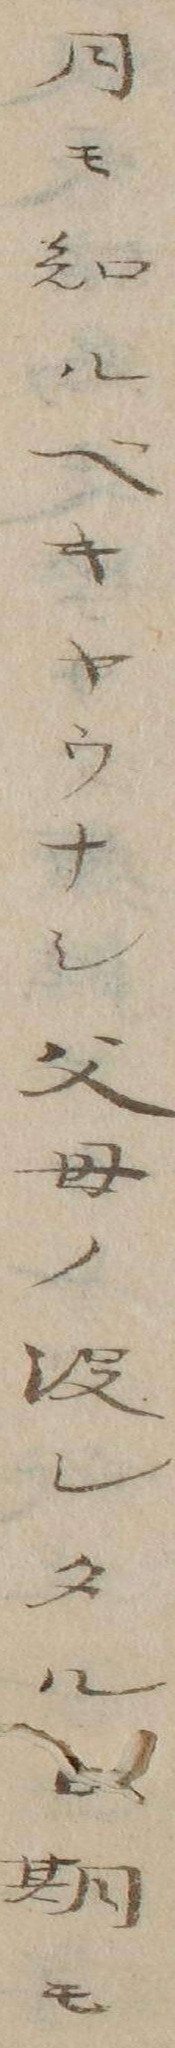月モ知ルベキヤウナシ父母ノ没シタル日期モ
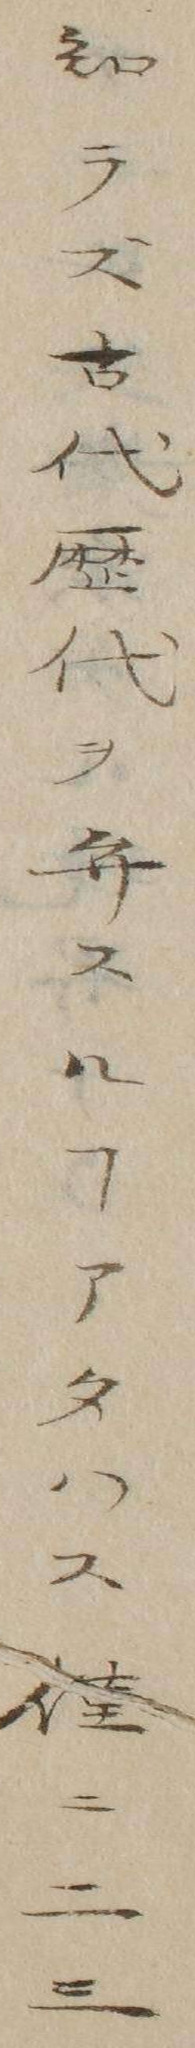知ラズ古代歴代ヲ弁スルヿアタハス僅ニ二三
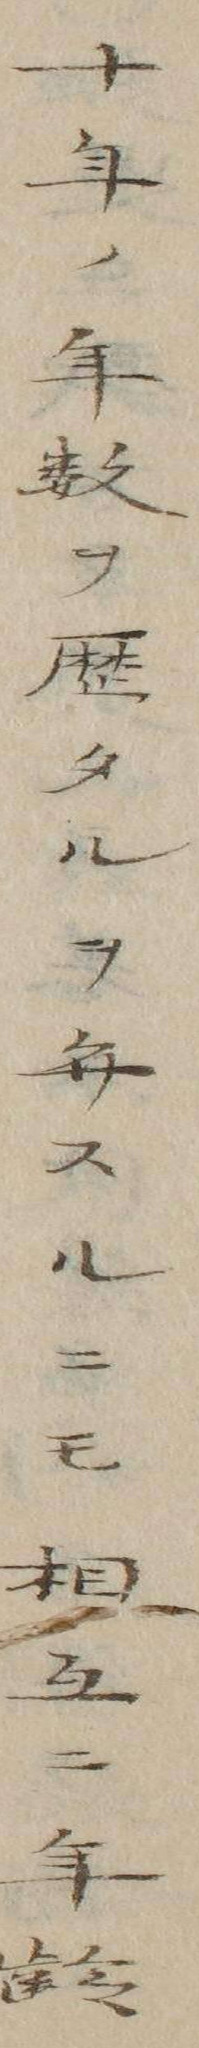十年ノ年数ヲ歴タルヲ弁スルニモ相互ニ年齢
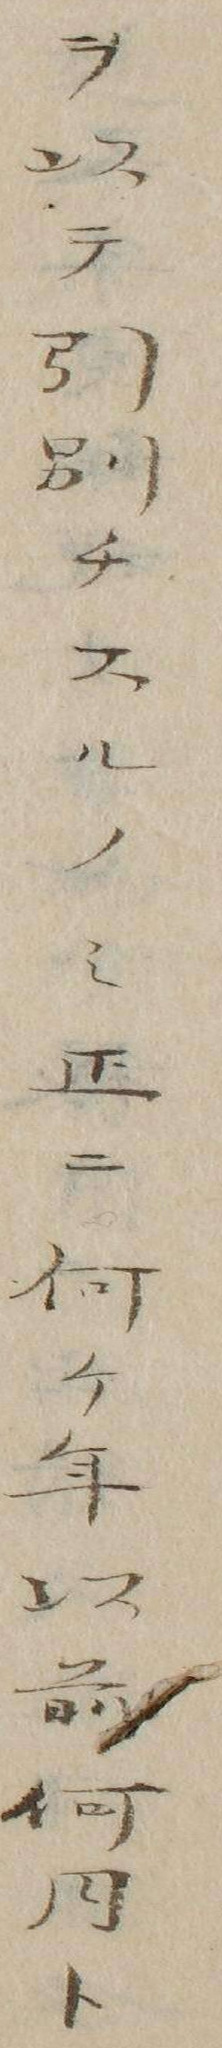ヲ以テ引別チスルノミ正ニ何ヶ年以前何月ト
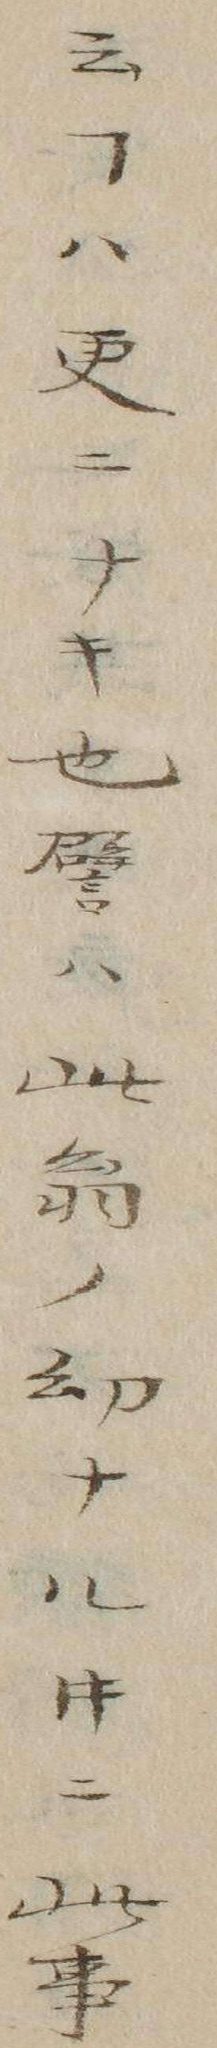云ヿハ更ニナキ也譬ハ此翁ノ幼ナルトキニ此事
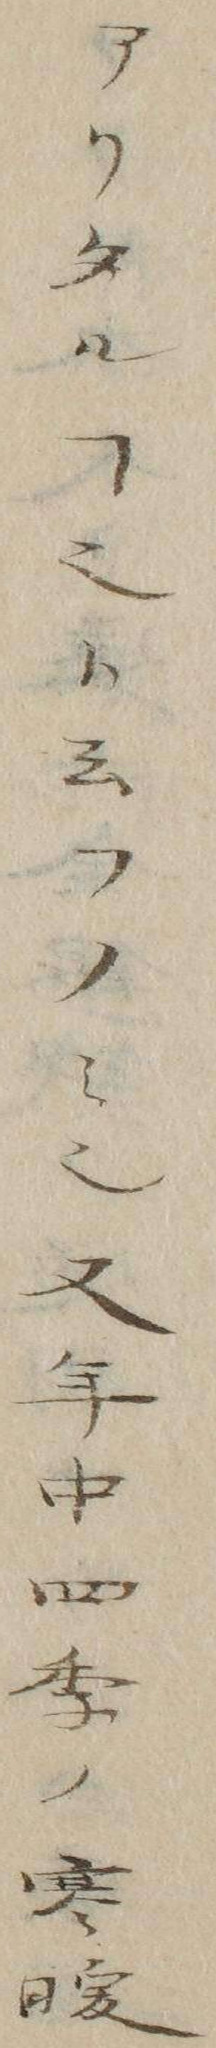アリタルヿ也ト云フノミ也又年中四季ノ寒暖
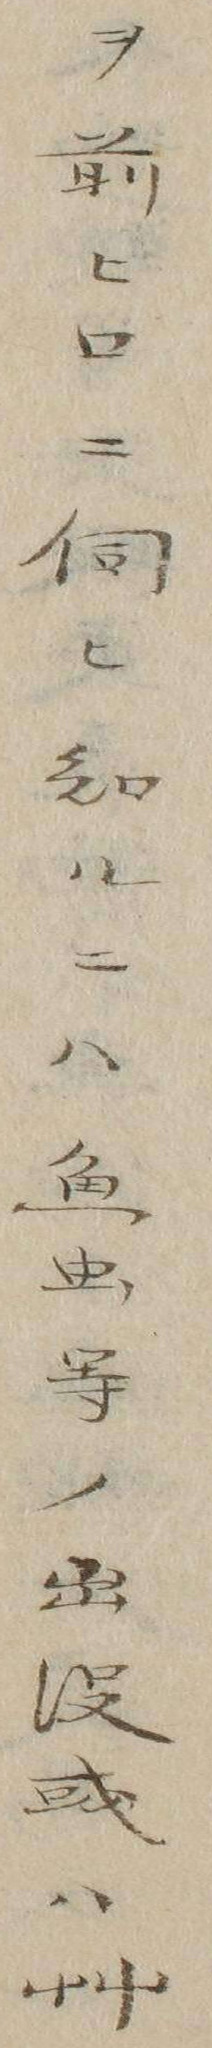ヲ前ヒロニ伺ヒ知ルニハ魚虫等ノ出没或ハ草
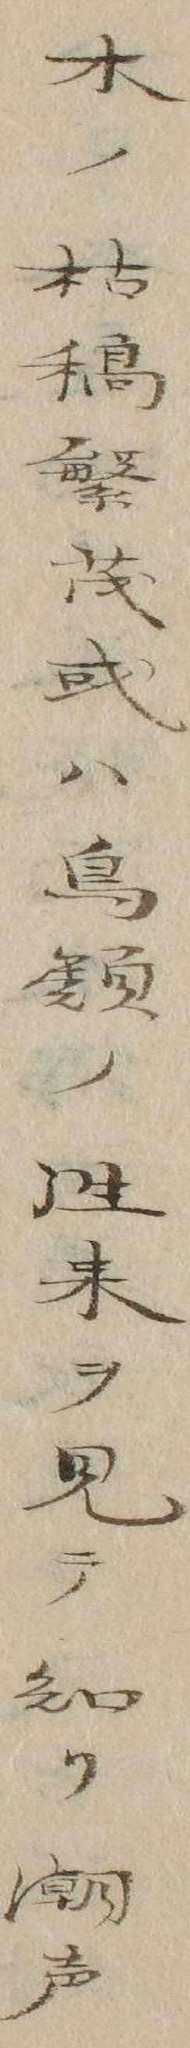木ノ枯稿繁茂或ハ鳥類ノ往来ヲ見テ知リ潮声
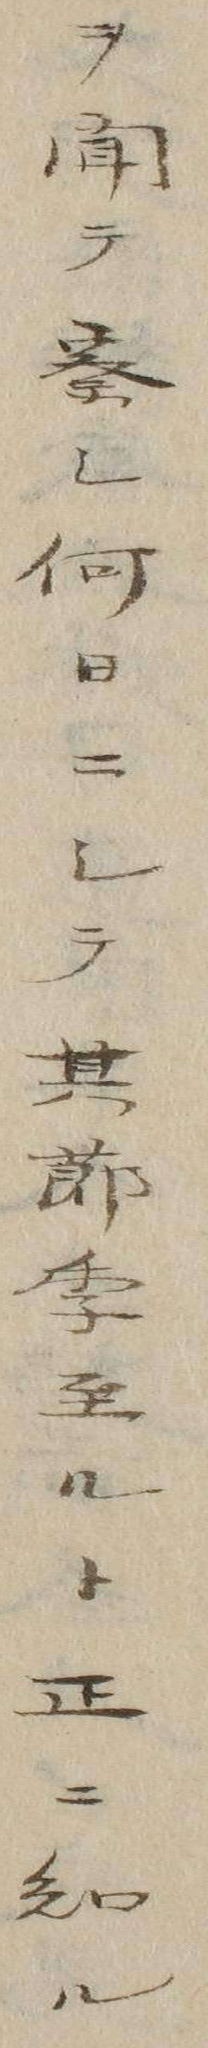ヲ聞テ察シ何日ニシテ其節季至ルト正ニ知ル
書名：蝦夷草紙（国文学研究資料館）
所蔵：国文学研究資料館
